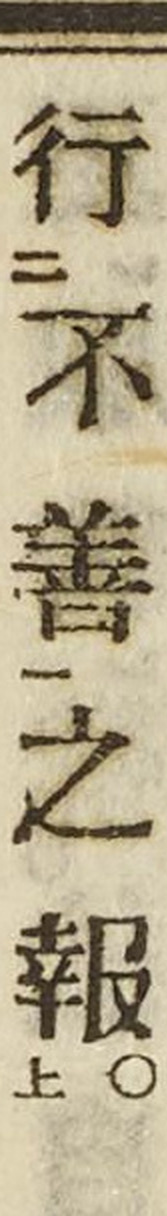行ニ不善之報。
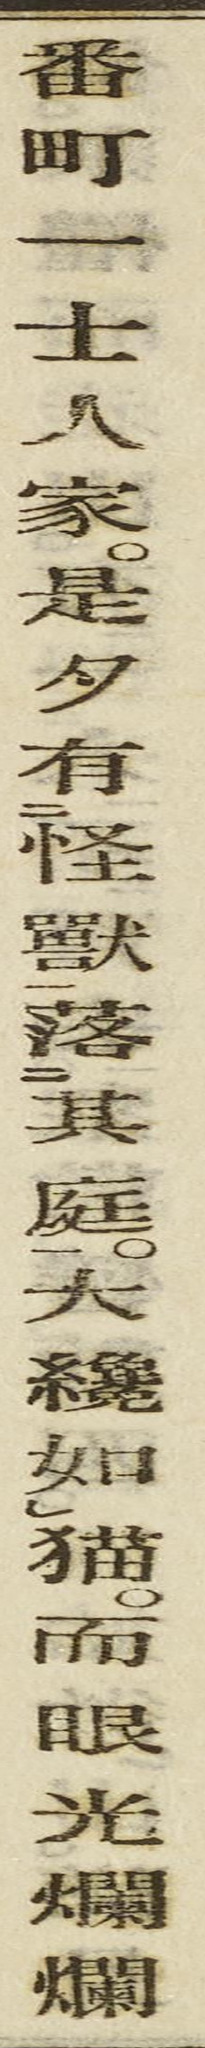番町一士人家。是夕有ニ怪獣落ニ其庭。大纔如猫。而眼光爛爛
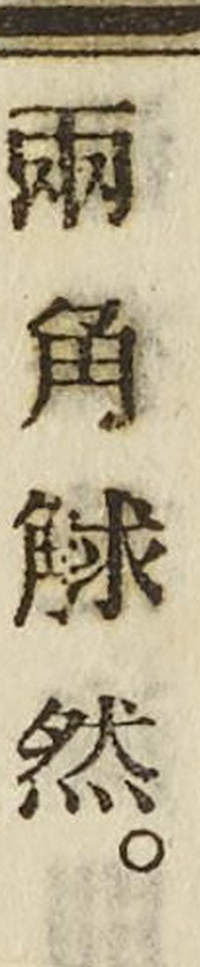両角觩然。
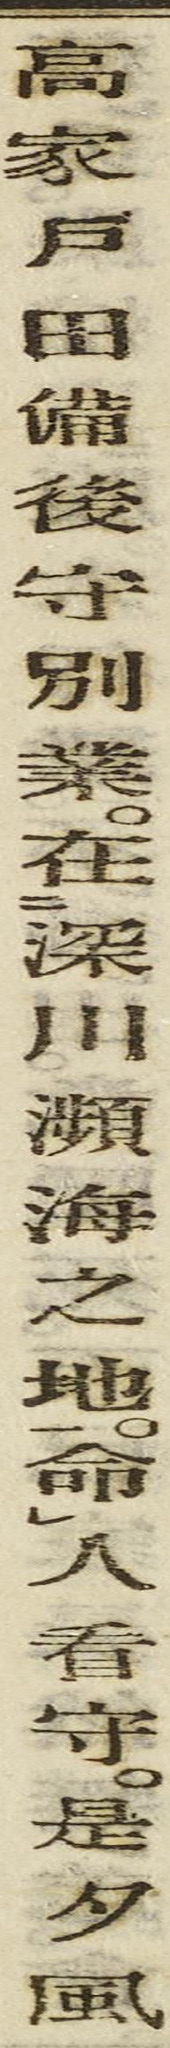高家戸田備後守別業。在ニ深川瀕海之地。命人看守。是夕風
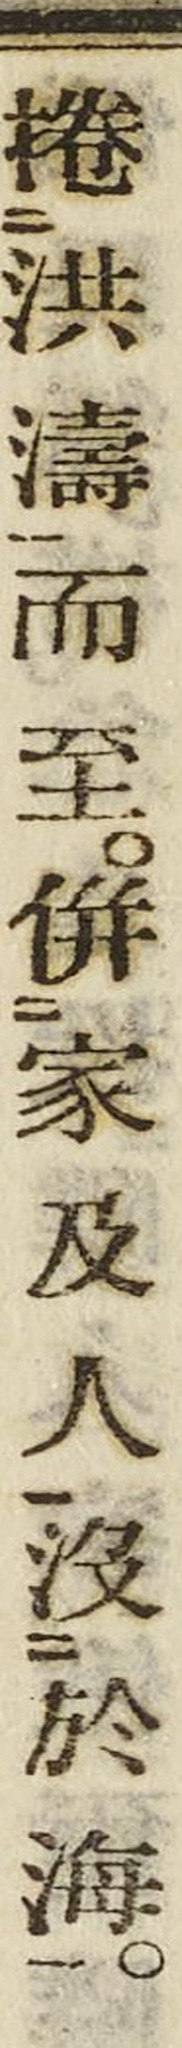捲ニ洪涛而至。併ニ家及人没ニ於海。
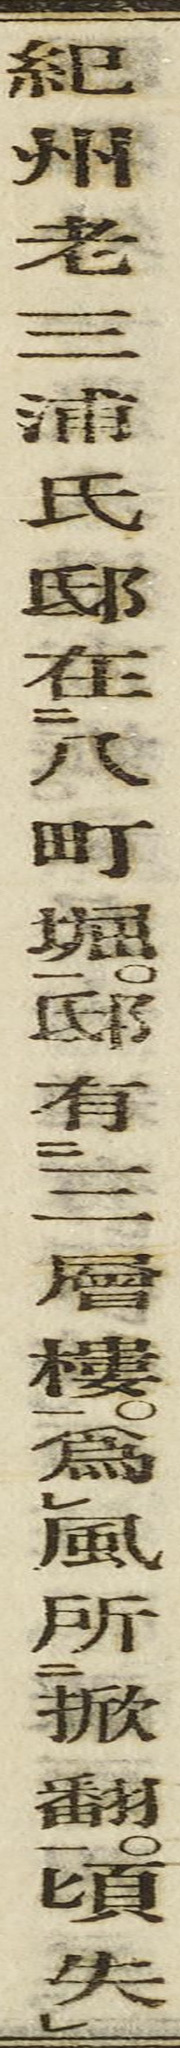紀州老三浦氏邸在ニ八町堀。邸有ニ三層楼。為風所ニ掀翻。頃失
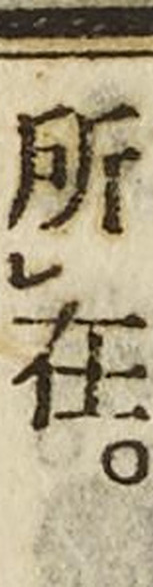所在。
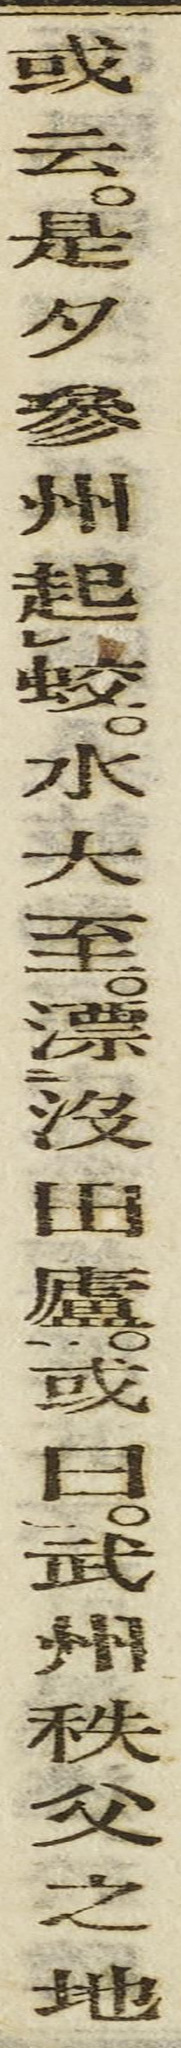或云。是夕参州起蚊。水大至。漂ニ没田廬。或曰。武州秩父之地
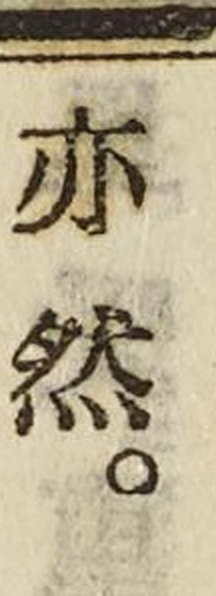亦然。
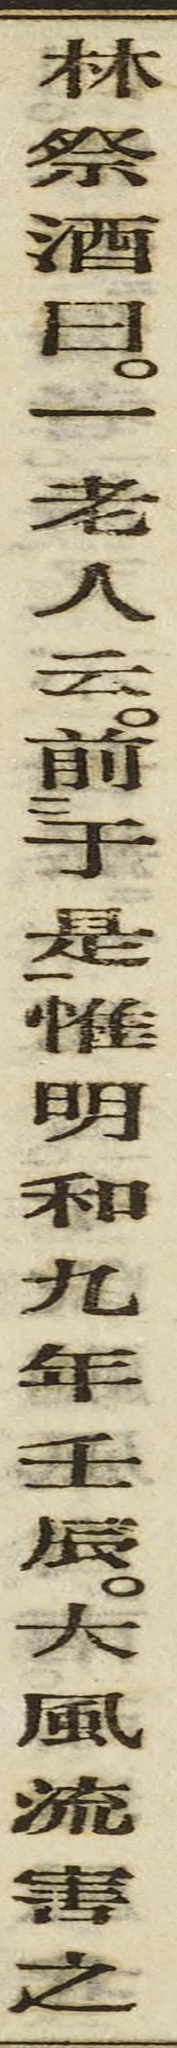林祭酒曰。一老人云。前ニ于是惟明和九年壬辰。大風流害之
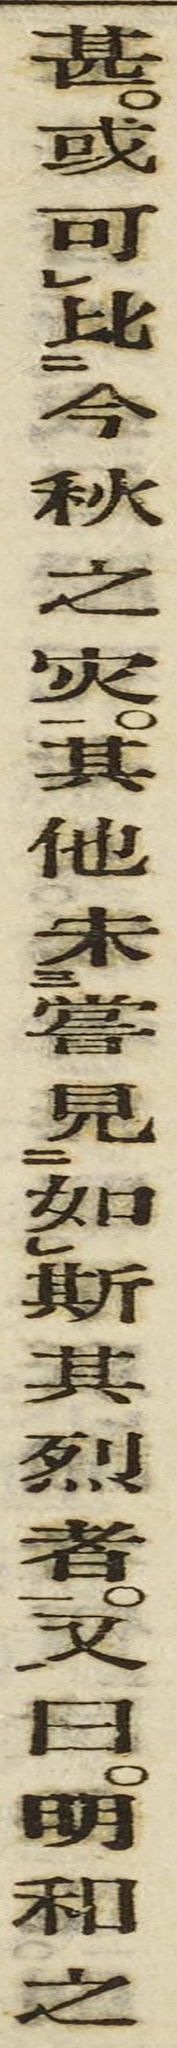甚。或可比ニ今秋之灾。其他未嘗見ニ如斯其烈者。又曰。明和之
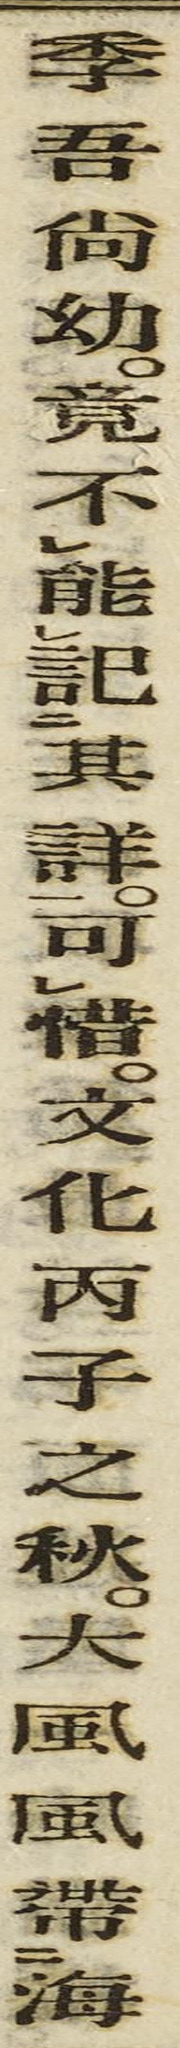季吾尚幼。竟不能記ニ其詳。可惜。文化丙子之秋。大風風帯ニ海
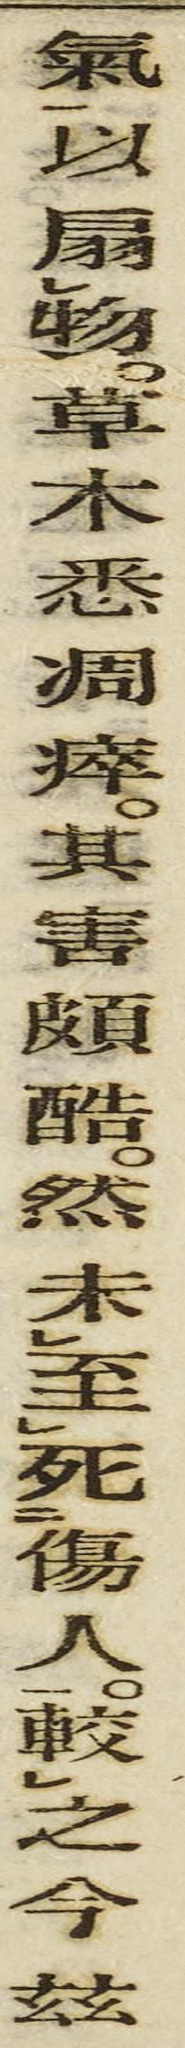気以扇物。草木悉凋瘁。其害頗酷。然未至死ニ傷人。較之今茲
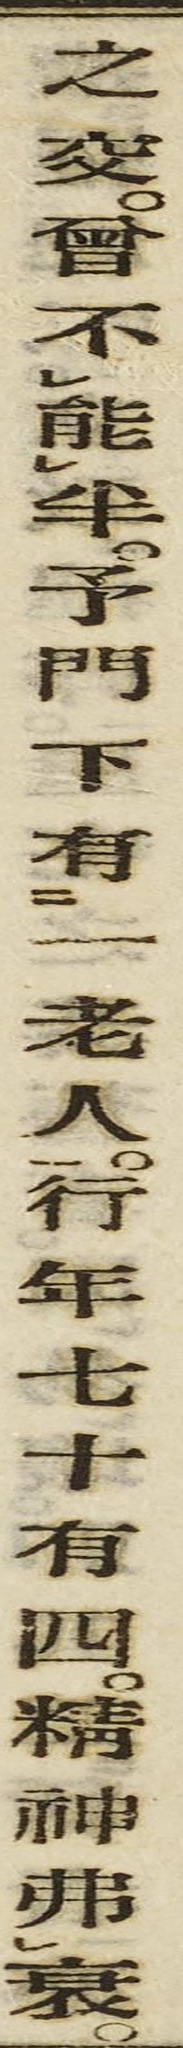之交。曾不能半。予門下有ニ一老人。行年七十有四。精神弗衰。
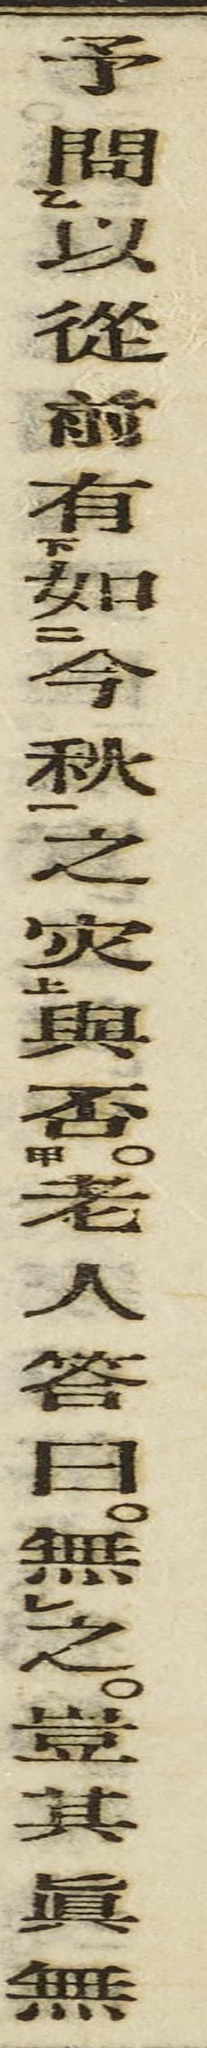予問以従前有如ニ今秋之灾与否。老人答曰。無之。豈其眞無
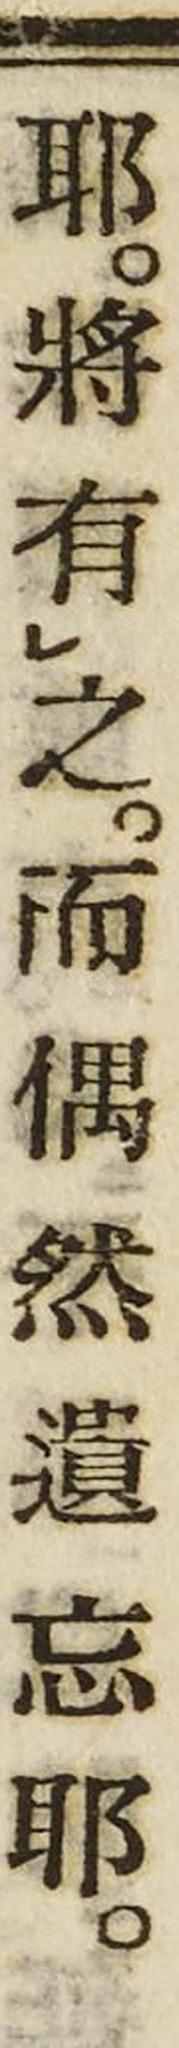耶。将有之。而偶然遺忘耶。
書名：史籍集覽　朝鮮陣古文・細井廣澤記・颶風紀事・天明七年將軍宣下次第書　全
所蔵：東京大学地震研究所図書室 Earthquake Research Institute Library, The University of Tokyo, JAPAN
